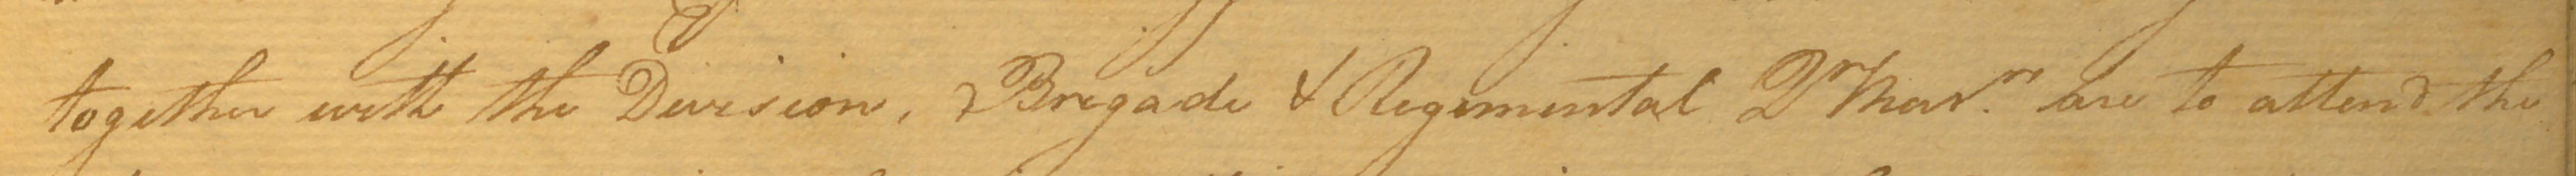together with the Division, Brigade & Regimental Q^r Mas^rs. are to attend the
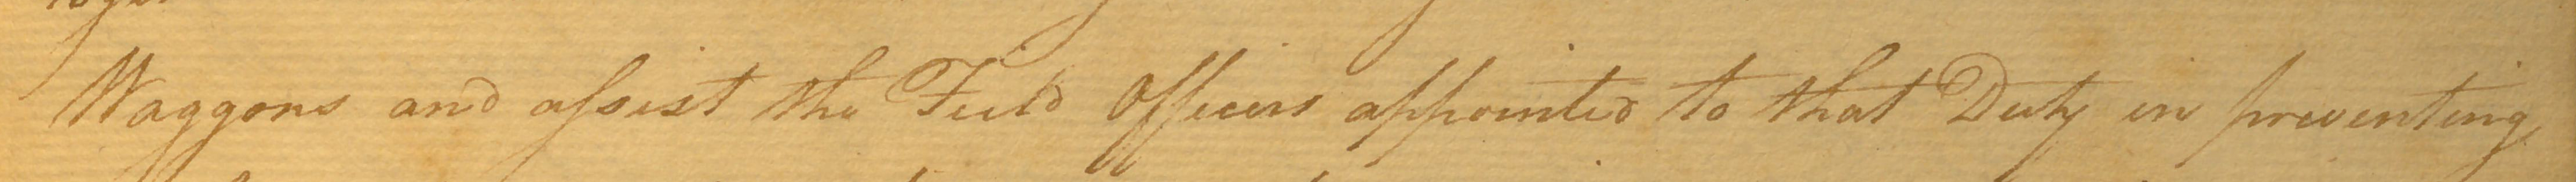Waggons and assist the Field officers appointed to that Duty in preventing
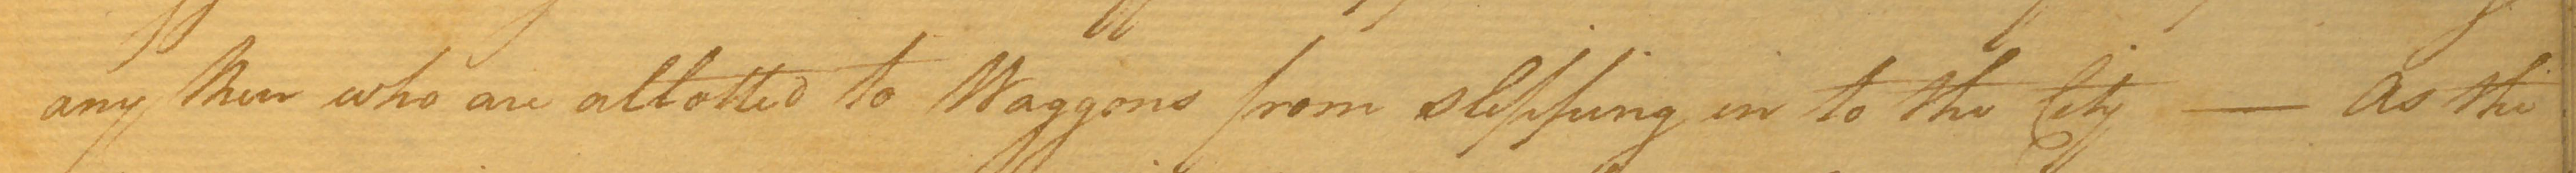any Men who are attended to Waggons from slipping in to the City- As the
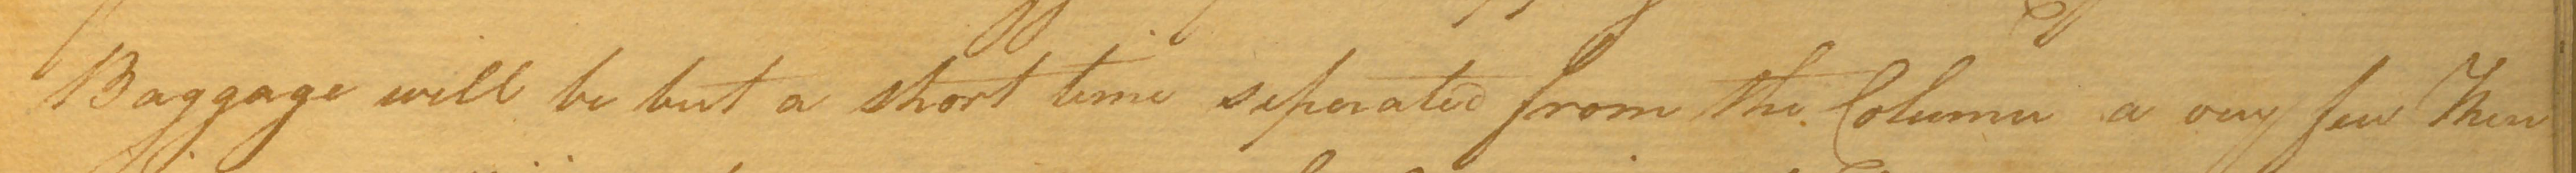Baggage will be but a short time separated from the Column a very few Men
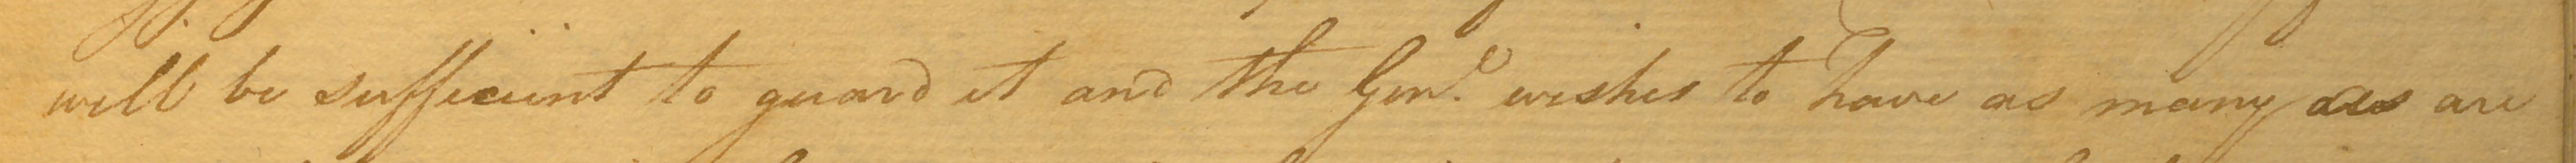will be sufficient to guard it and the Gen^l wishes to have as many as are
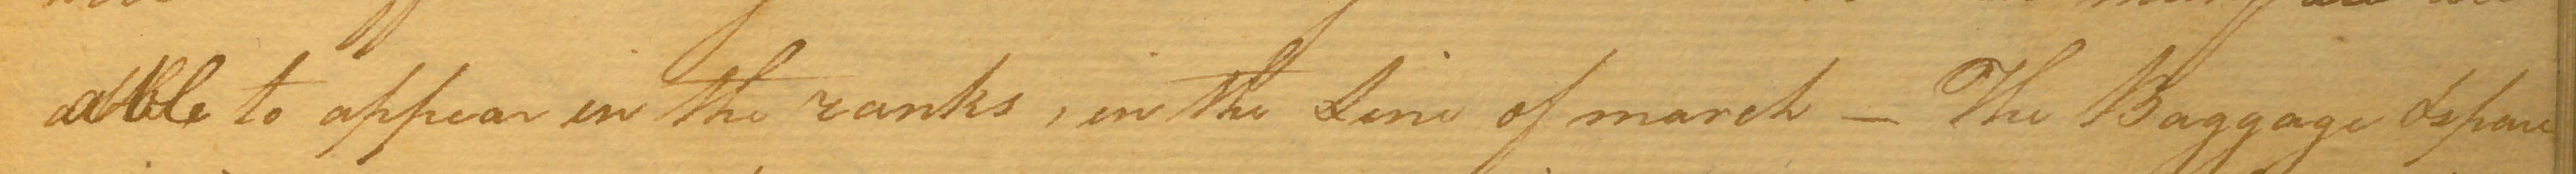able to appear in the ranks, in the Line of march- The Baggage & spare
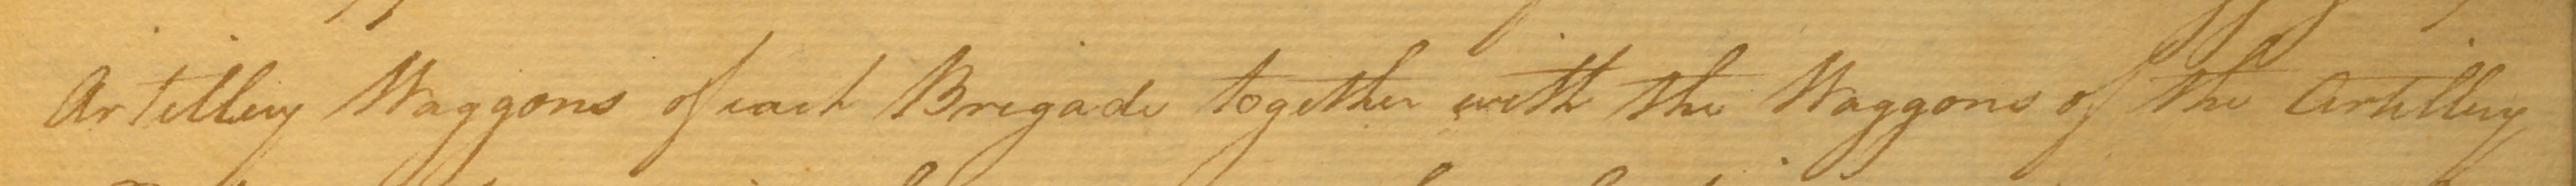Artillery Waggons of each Brigade together with the Waggons of the Artillery
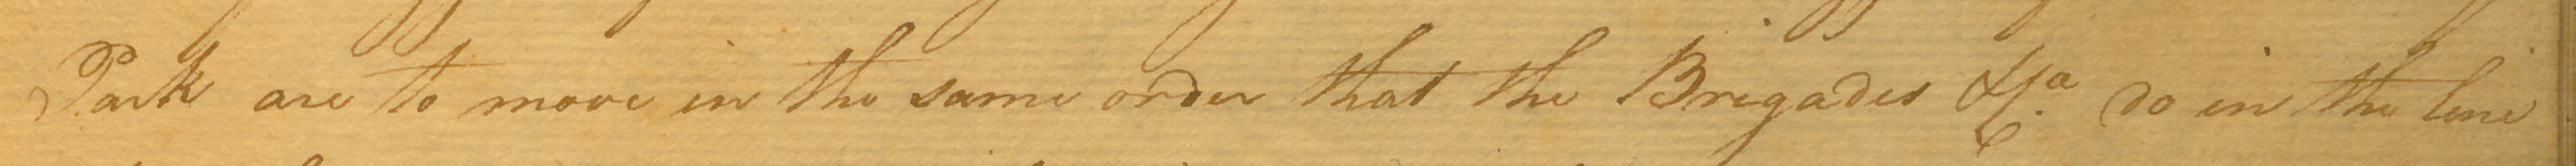Park are to move in the same order that the Brigades &c^a do in the line
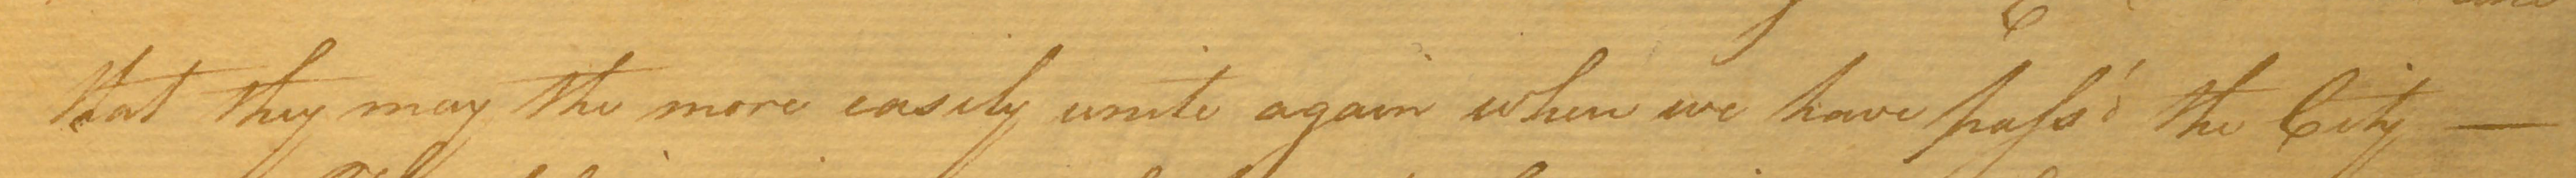that they may the more easily unite again when we have pass'd the City-
